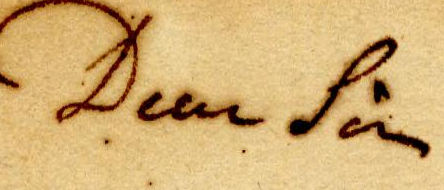Dear Sir
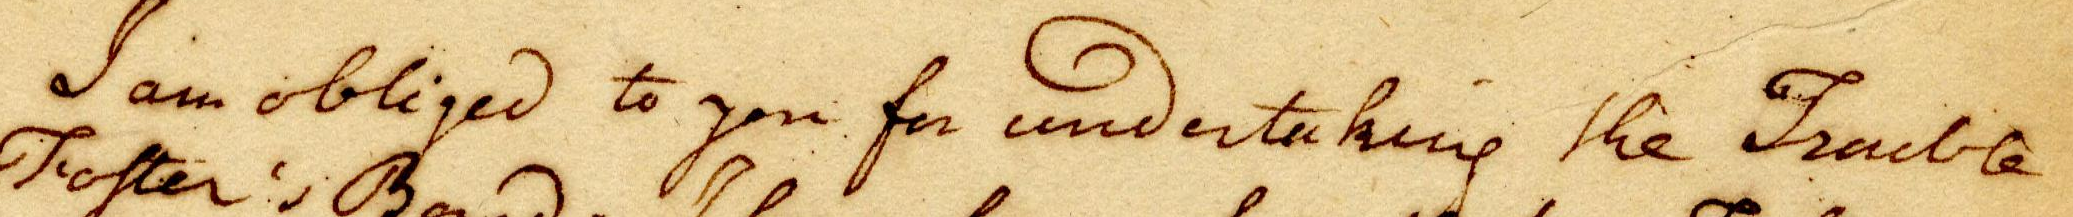I am obliged to you for undertaking the Trouble
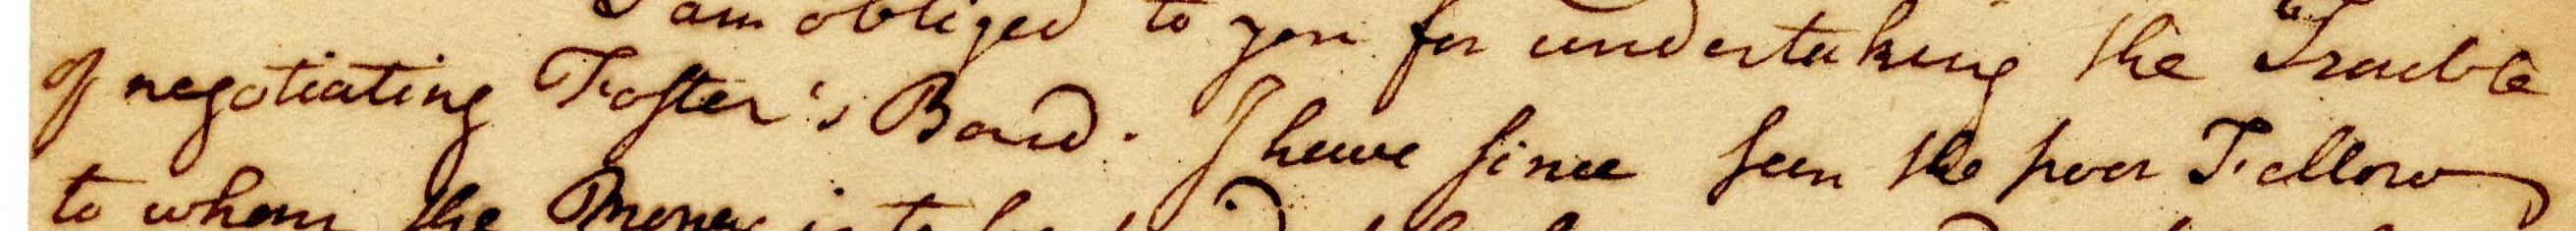of negotiating Foster's Bond. I have since seen the poor Fellow
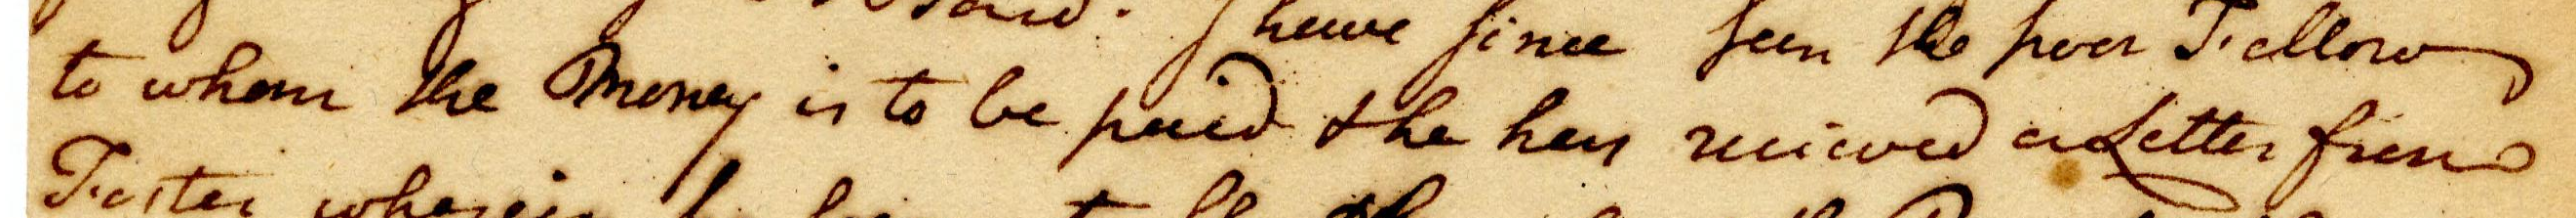to whom the Money is to be paid & he has recieved a Letter from
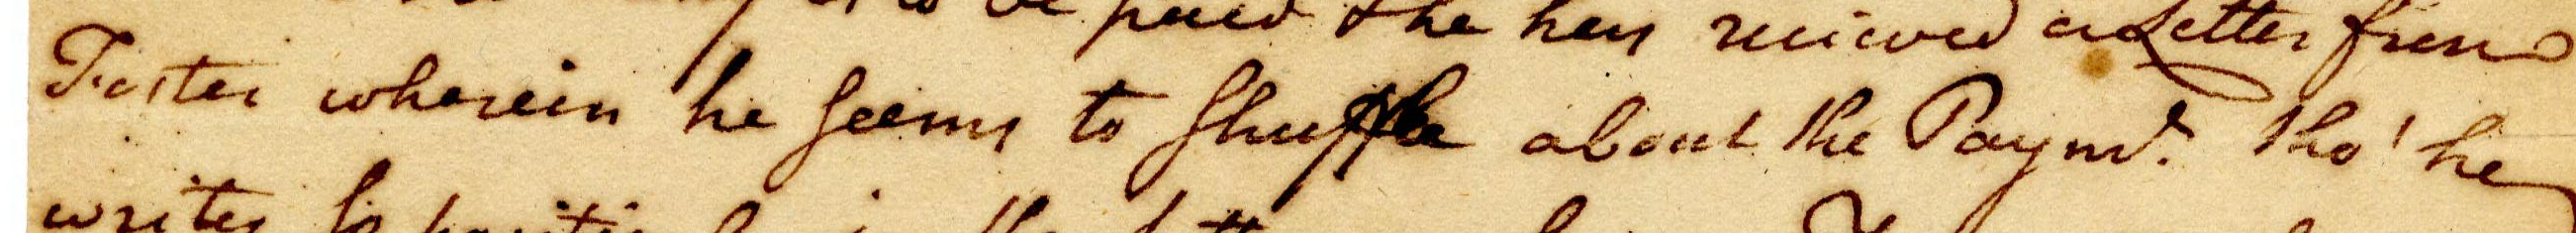Foster wherein he seems to Shuffle about the Paym^t. tho he
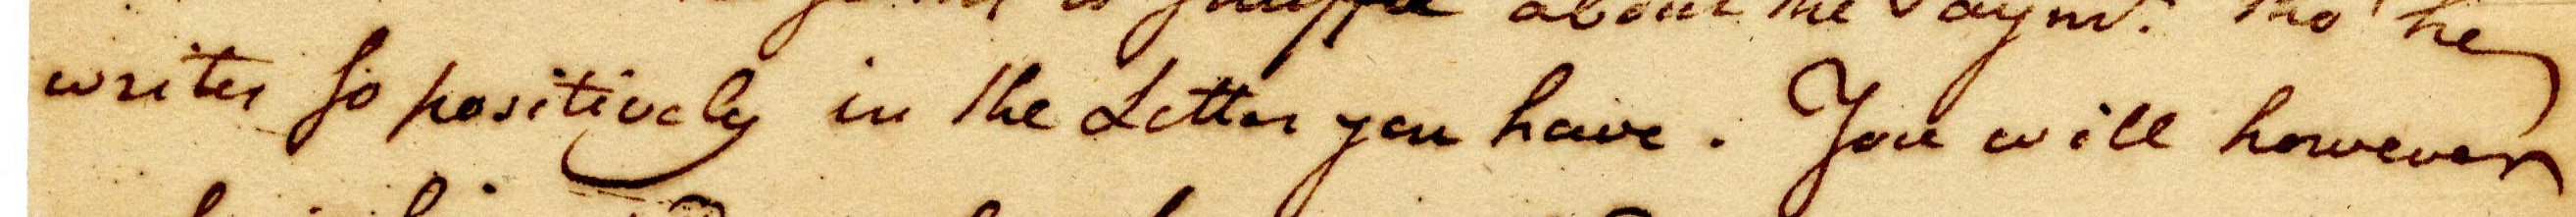writes so positively in the Letter you have. You will however
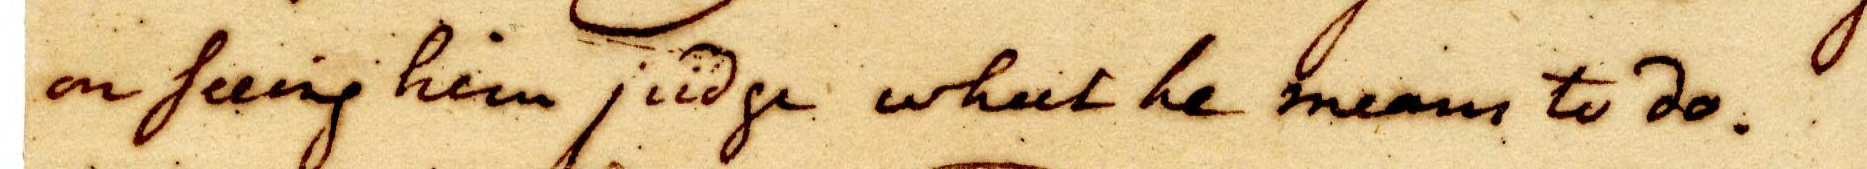on seeng him judge what he means to do.
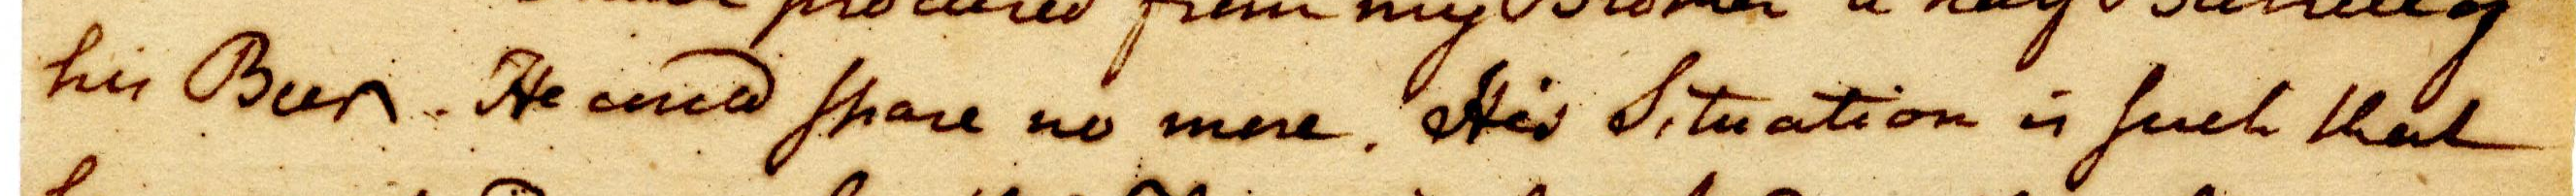his Beer. He could share no more. His Situation is such that
